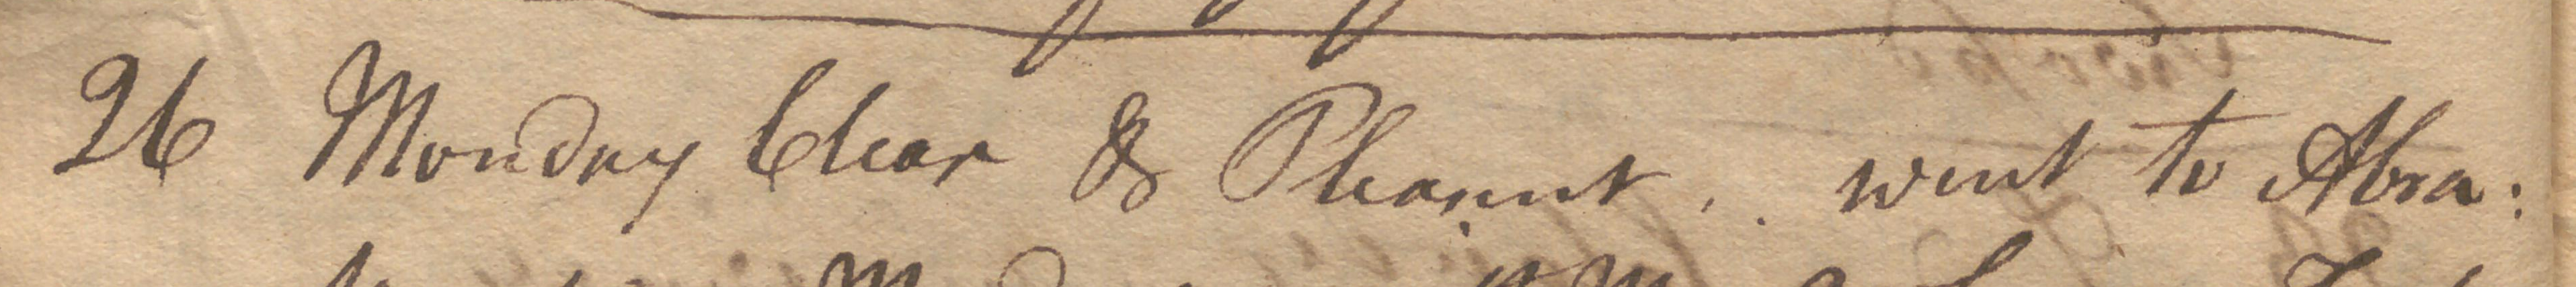26 Monday Clear & Pleasent, went to Abra-
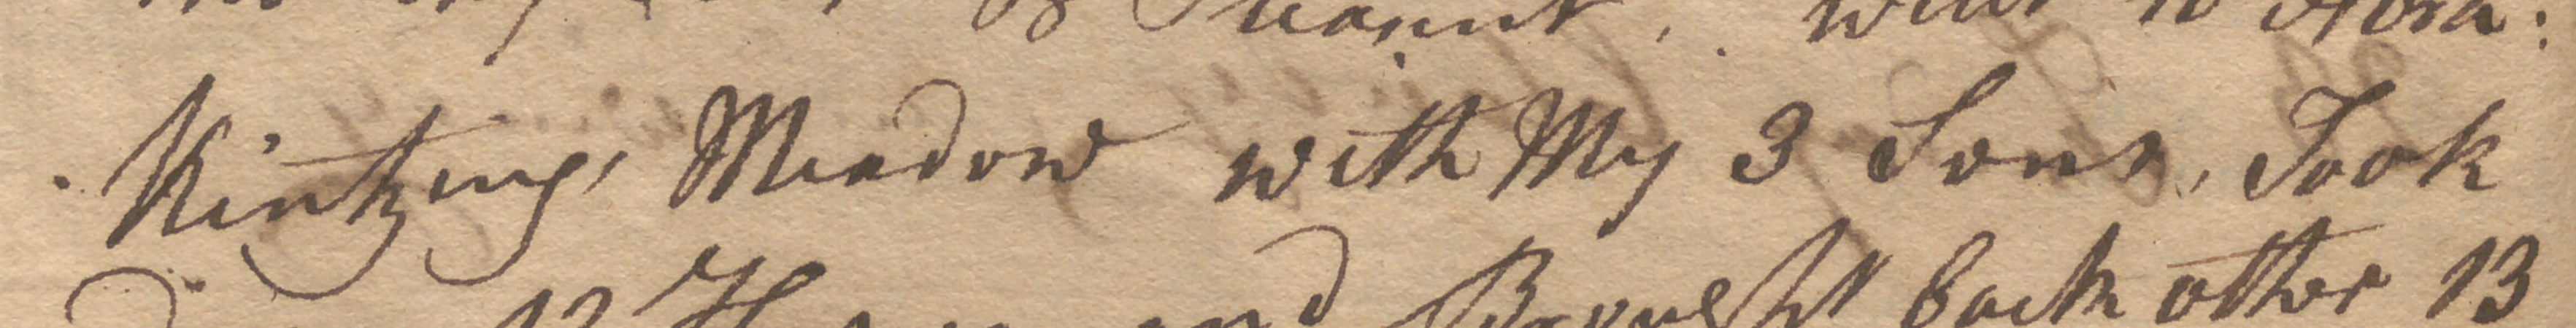Kintzings Meadow with My 3 sons, Took
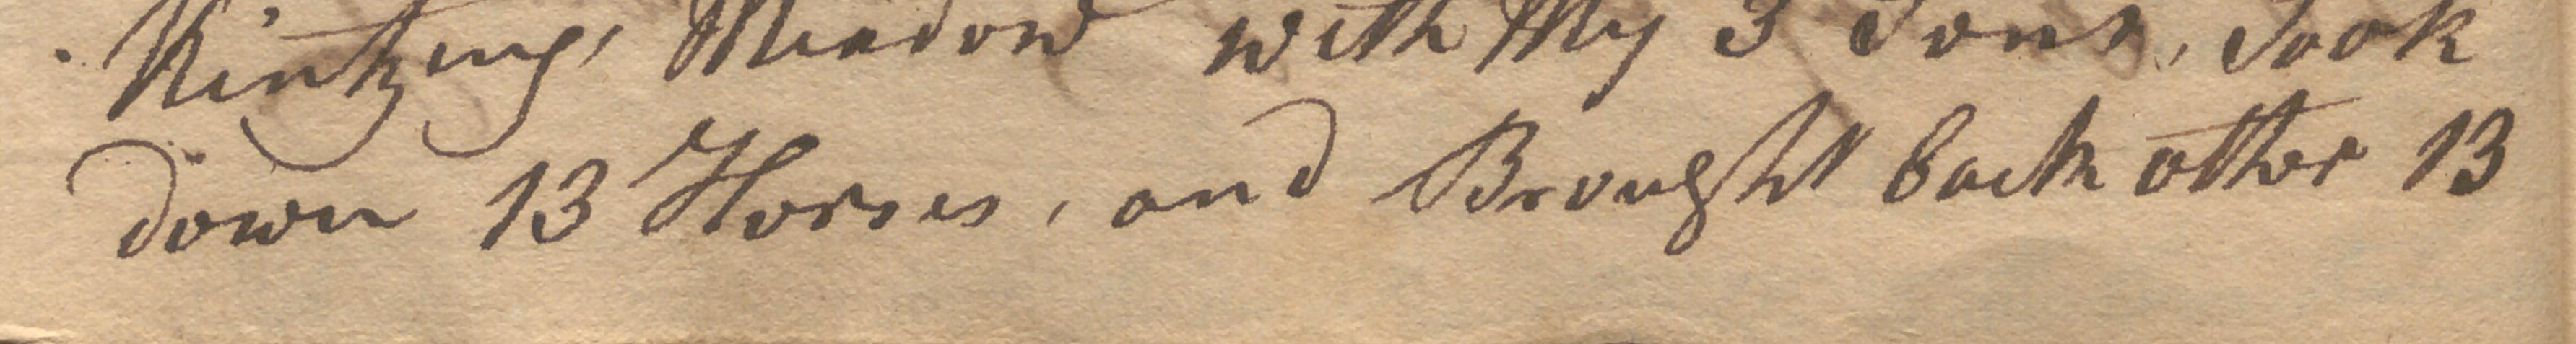down 13 Horses, and Brought back other 13
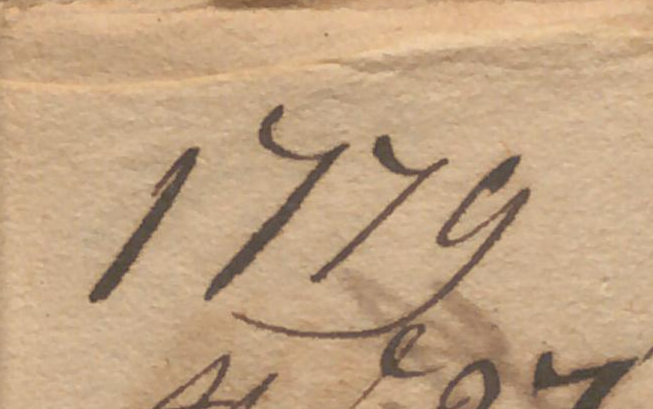1779
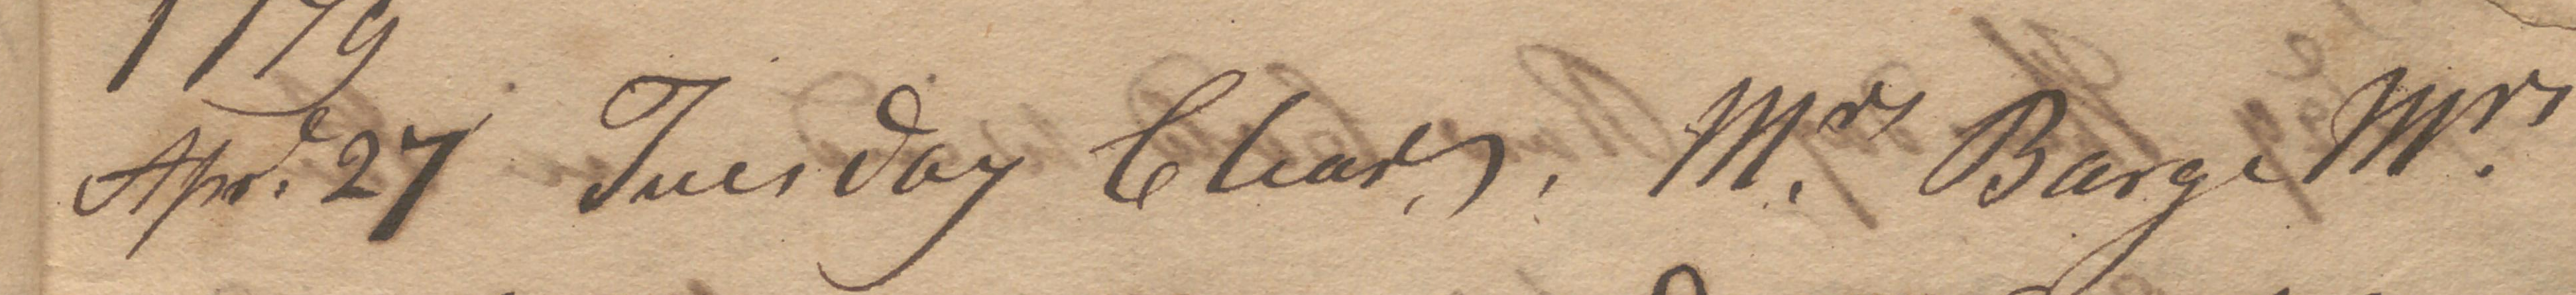Apr^l. 27 Tuesday Clear. M^rs. Barg M^r.
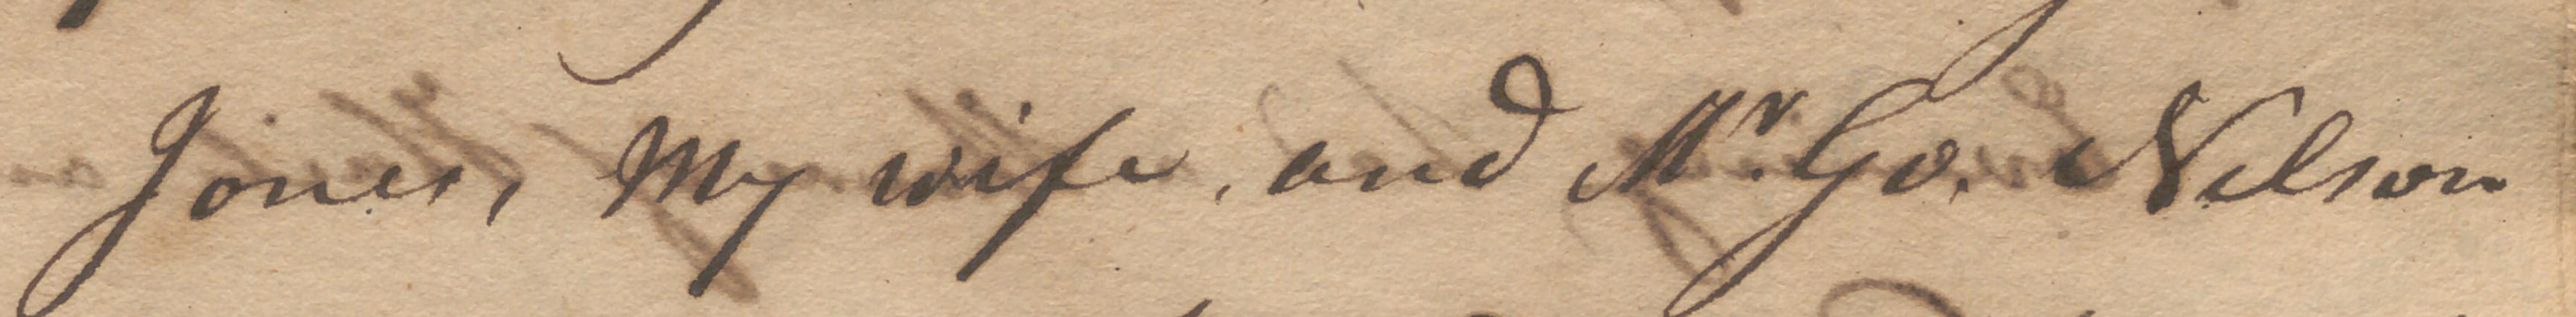Jones, my wife, and M^r. Ge. Nelson
